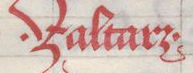.Żaltarz.
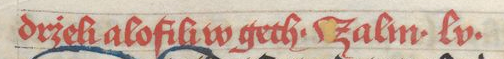drżeli a loſili w geth.Zalm.lv.
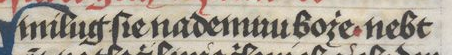milug ſie nademnu boże.nebt
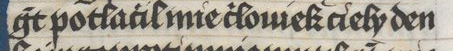ḡt potlaċil mie ċlouíek ciely den
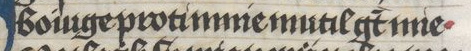boiuge proti mnie mutil ḡt mie.
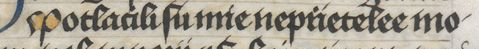Potlaċiliſu mie nepṙíetelee mo¬
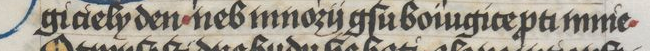gi ciely den.neb mnozij gſu boiugíce ꝓti mnie.
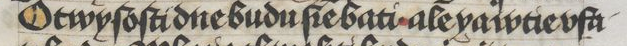Otwyſoſti dne budu ſie bati.ale ya wtie vſa¬
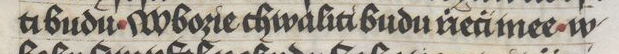ti budu.Wbozie chwaliti budu ṙieċí mee.w¬
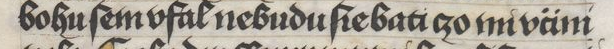bohu ſem vſal nebudu ſie bati czo mi vċiní
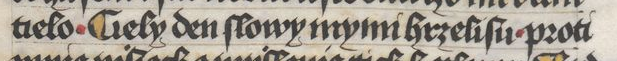tielo.Cely den ſlowy mymi hrzeliſu.proti
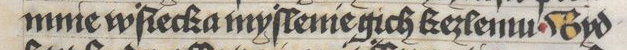mnie wẛiecka myẛleníe gich kezlemu.Byd¬
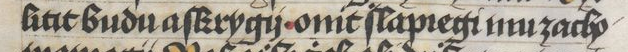litit budu a ſkrygij.onit ẛlapiegi mu zacho¬
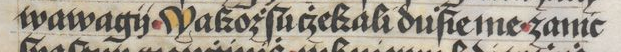wawagij.Yakoż ſu cżekali duẛie me.zanic
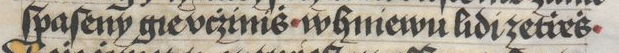ſpaſeny gie vcżiníṡ.w hniewu lidi zetṙeṡ.
